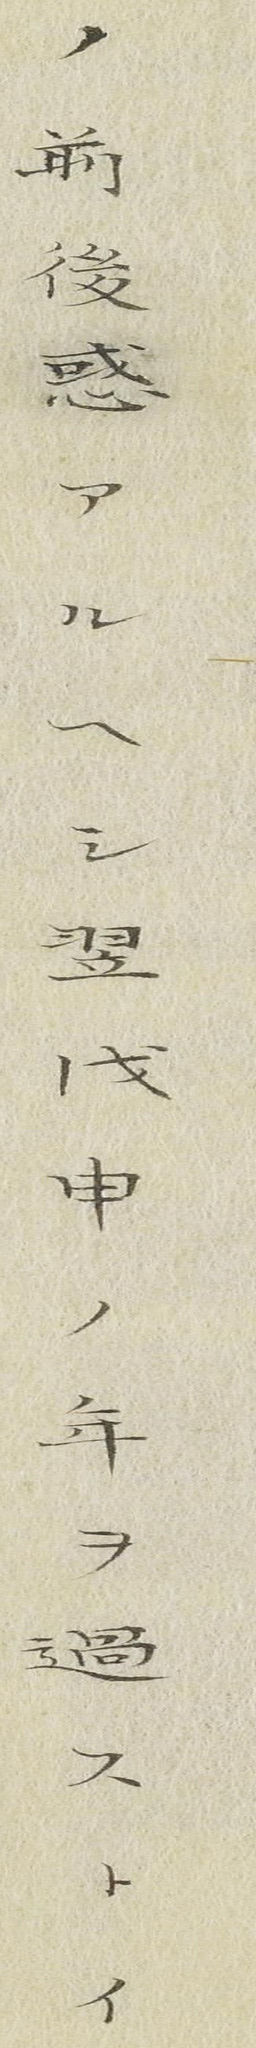ノ前後惑アルヘシ翌戌申ノ年ヲ過ストイ
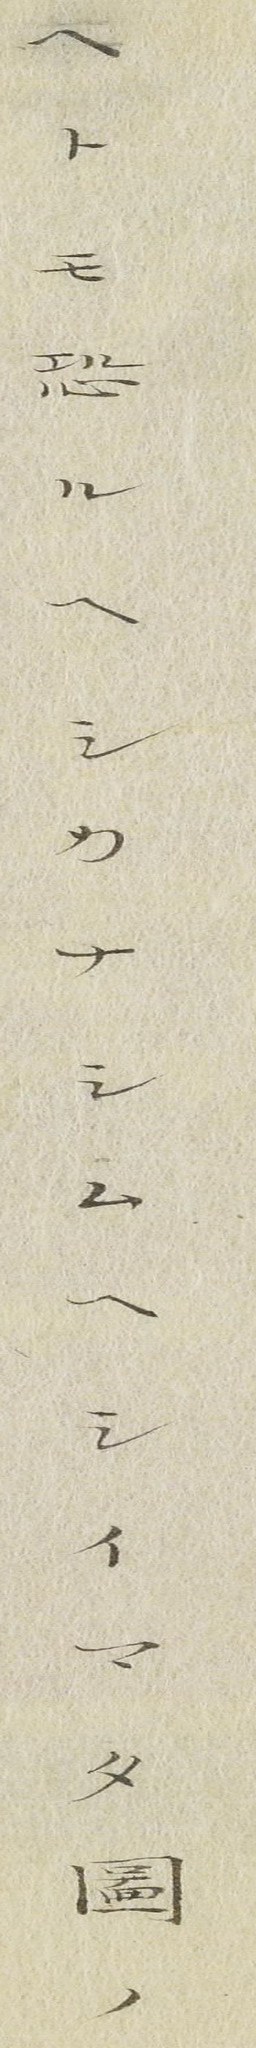ヘトモ恐ルヘシカナシムヘシイマタ図ノ
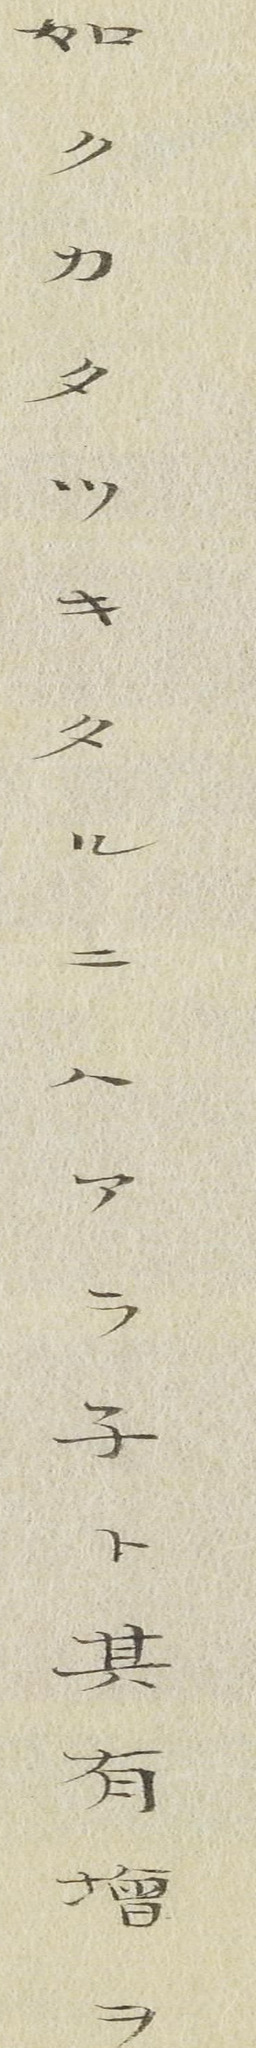如クカタツキタルニハアラ子ト其有増ヲ
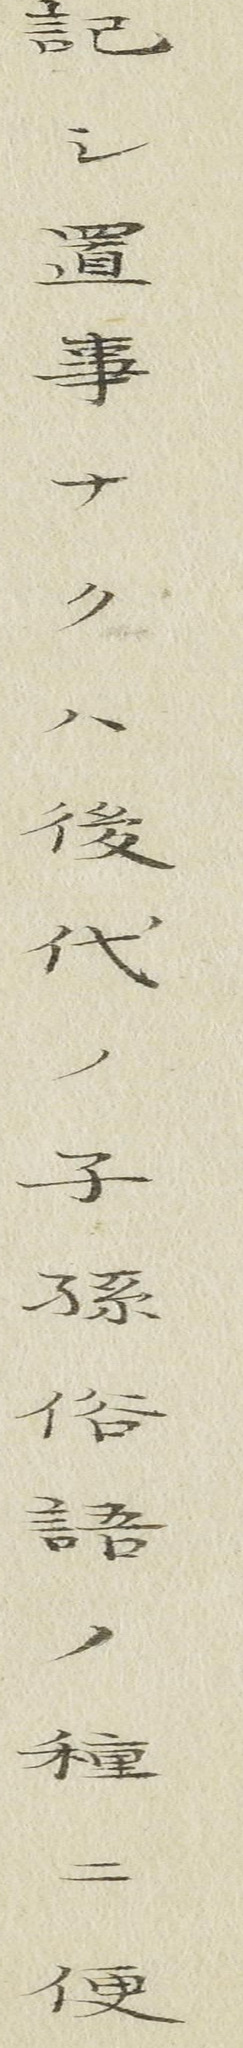記シ置事ナクハ後代ノ子孫俗語ノ種ニ便
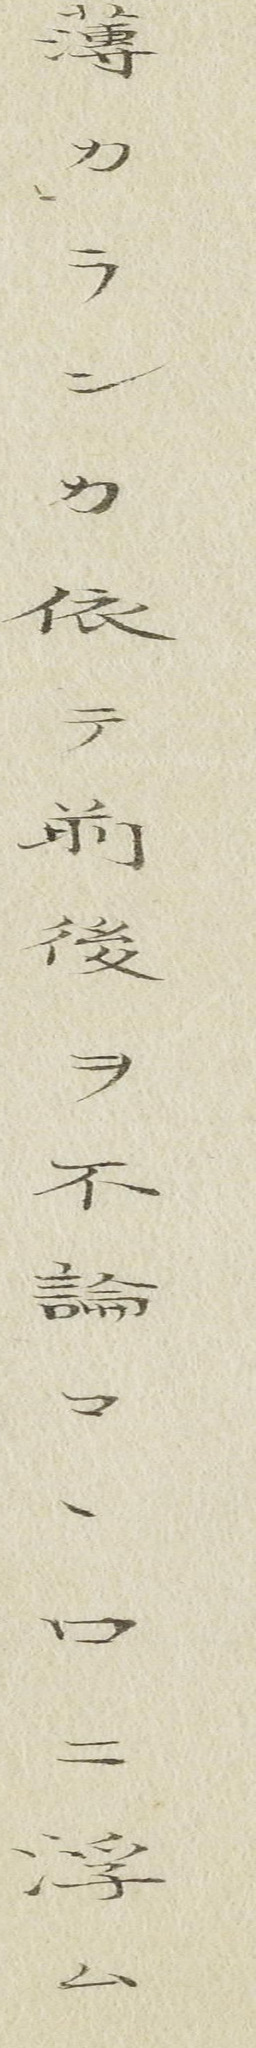簿カランカ依テ前後ヲ不論マヽロニ浮ム
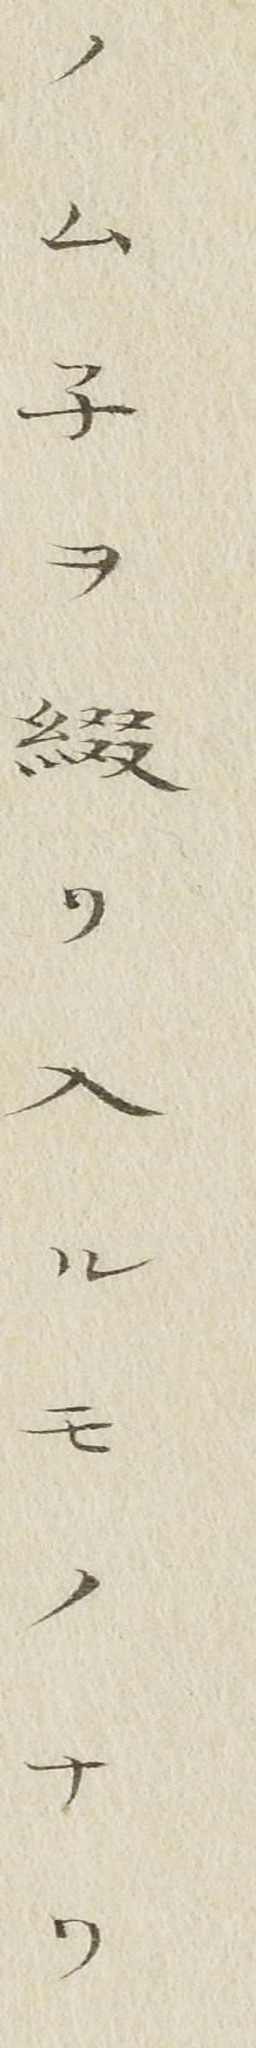ノム子ヲ綴リ入ルモノナリ

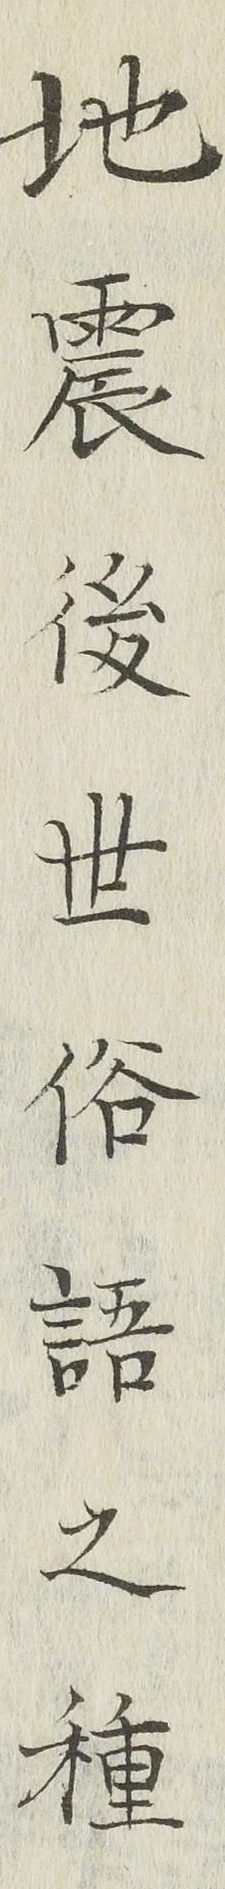地震後世俗語之種五
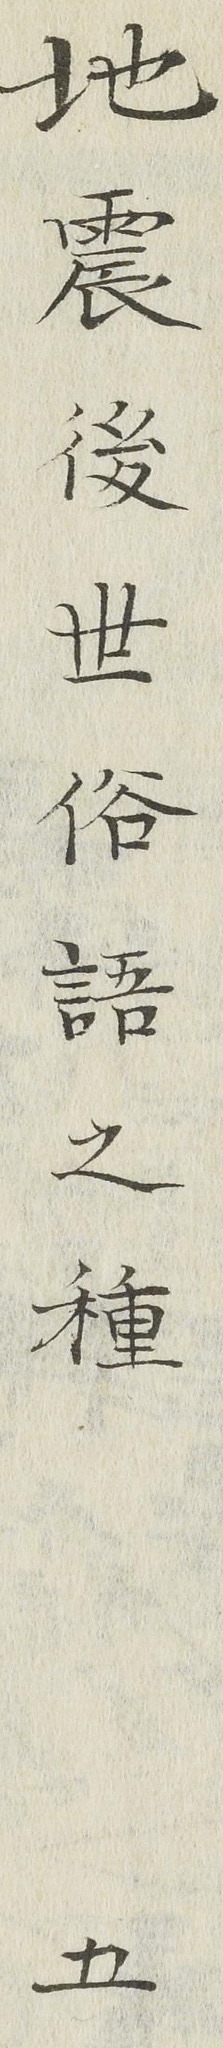地震後世俗語之種五

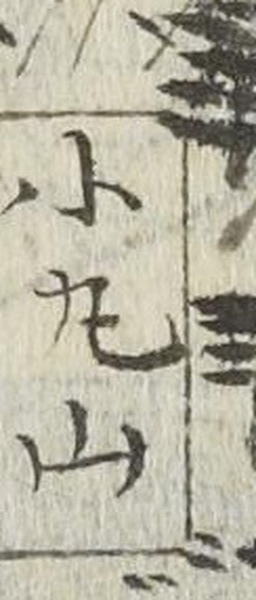小丸山
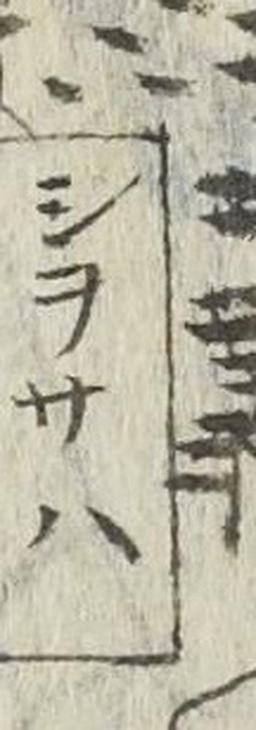シヲサハ
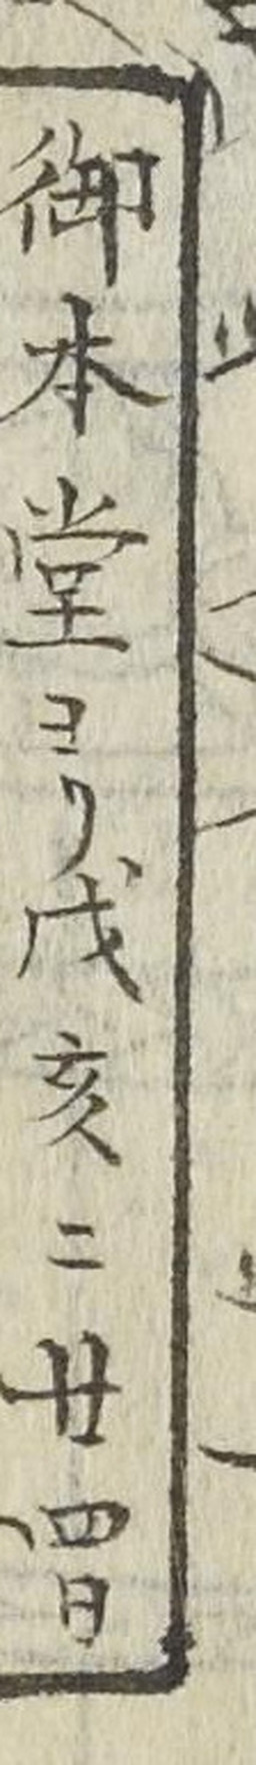御本堂ヨリ戌亥ニ廿四日
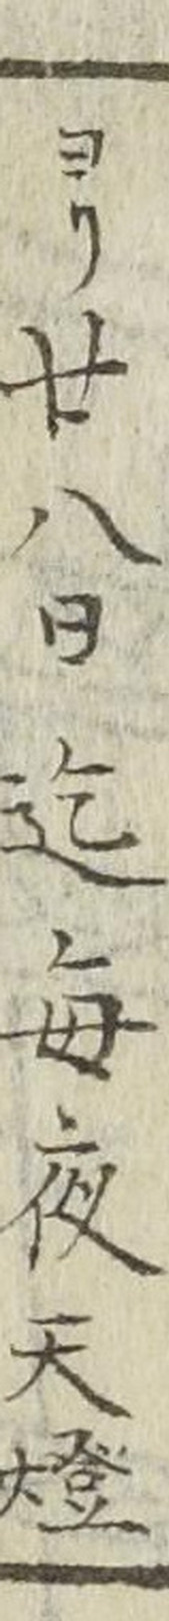ヨリ廿八日迄毎夜天燈
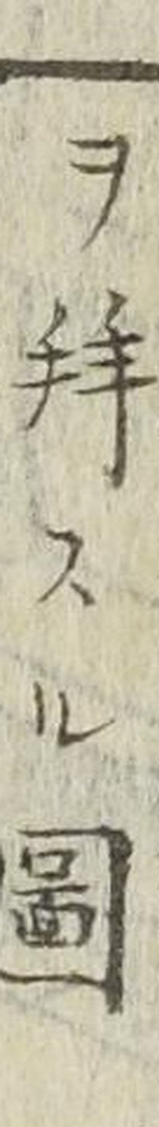ヲ拝する図
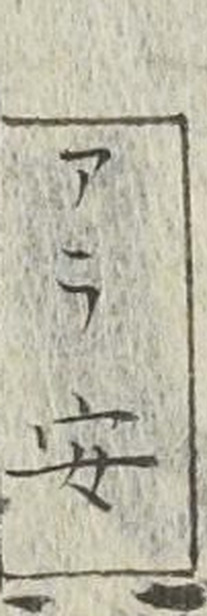アラ安
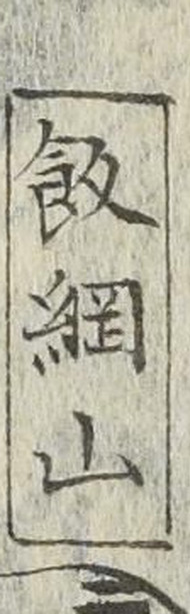飯綱山
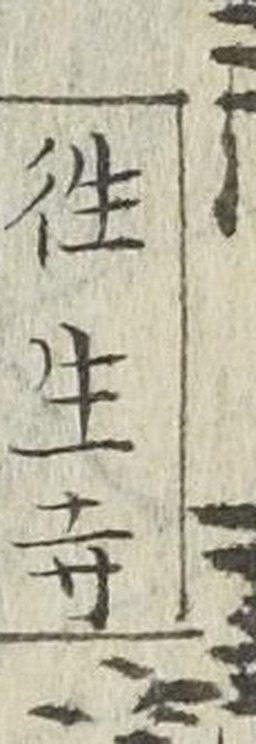往生寺
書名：地災撮要　地震之部　巻ノ二
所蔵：東京大学地震研究所図書室 Earthquake Research Institute Library, The University of Tokyo, JAPAN
